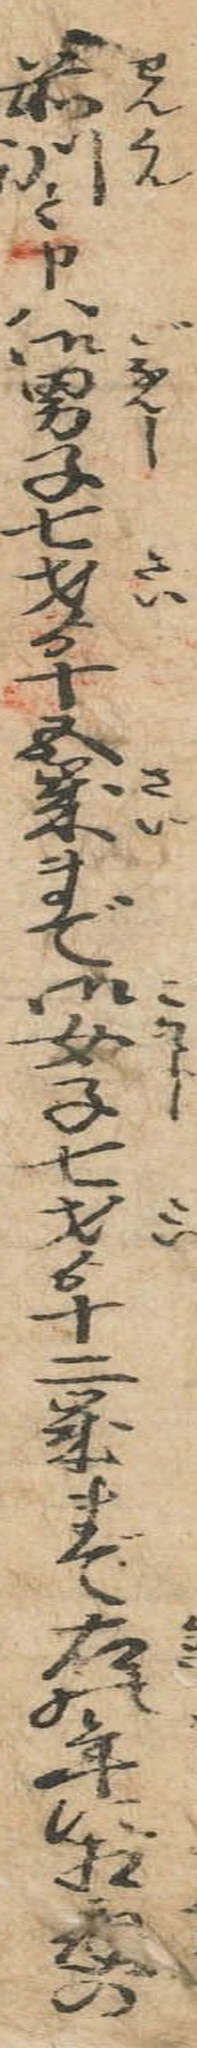前訓と申は御男子七才ゟ十五歳まで御女子七才ゟ十二歳まで右の年に相応の
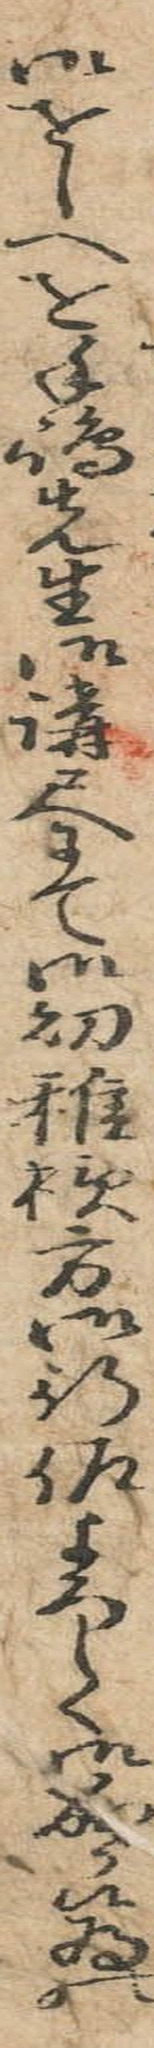御をしへを手嶋先生御講尺にて御幼稚様方御行作よろしく御成候為の
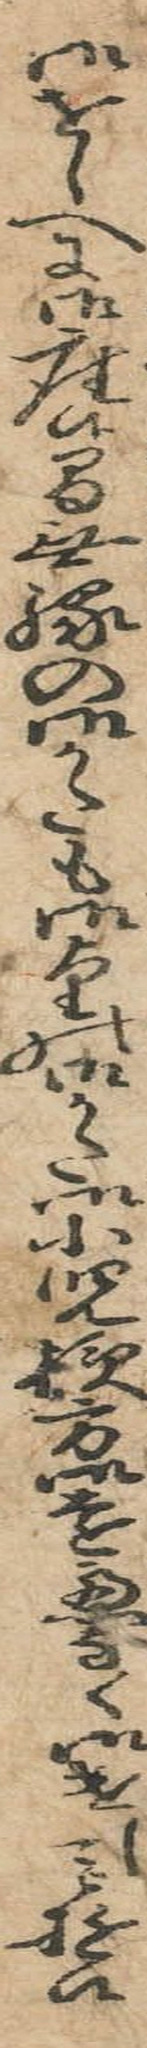御をしへに御座候間無縁の御かたも御望の御かた御小児様方御遠慮なく御遣し可被遊候
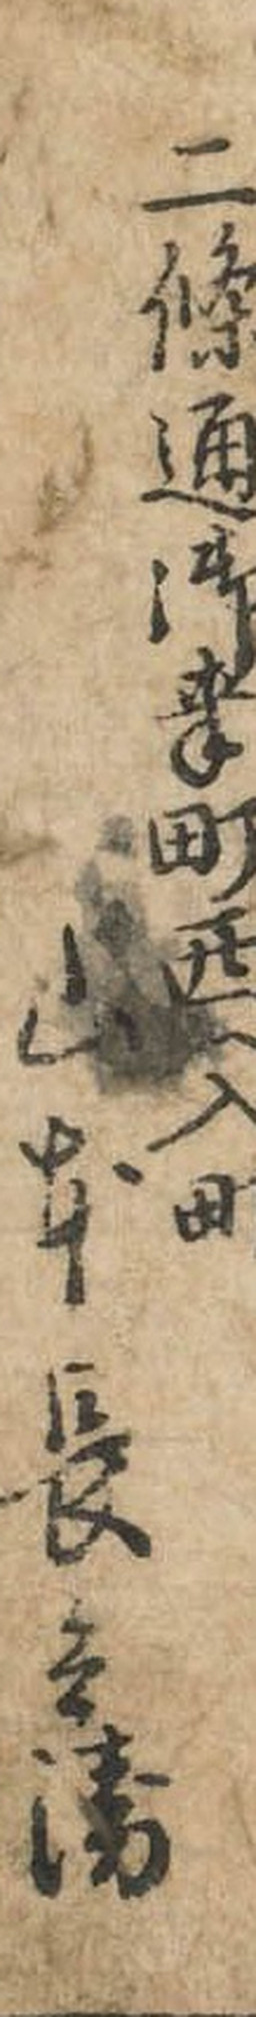山本長兵衛
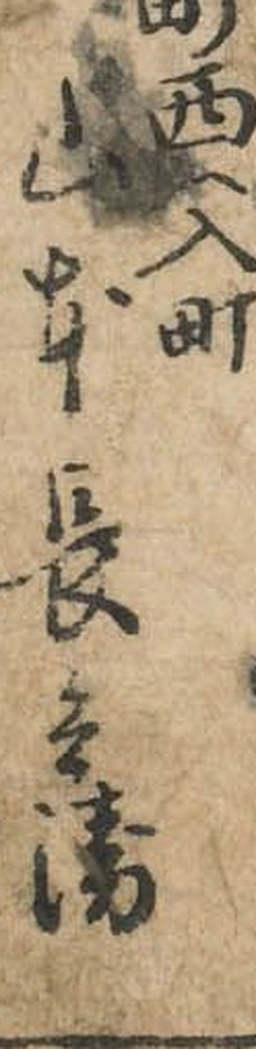山本長兵衛
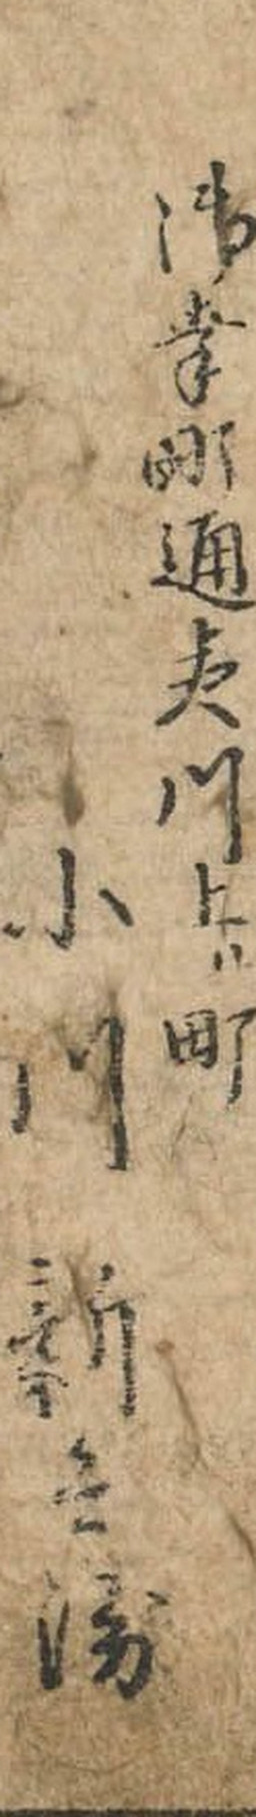小川新兵衛
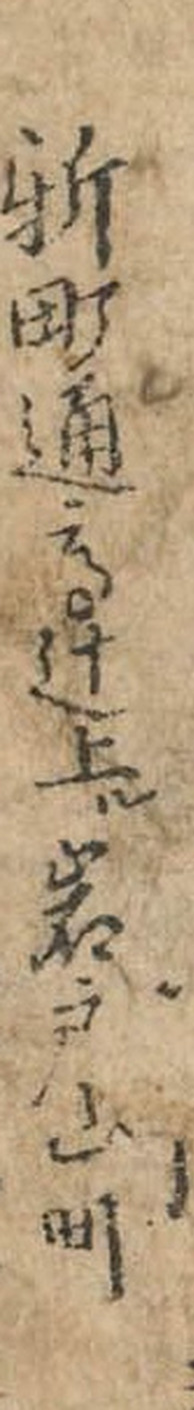新町通高辻上る岩戸山町
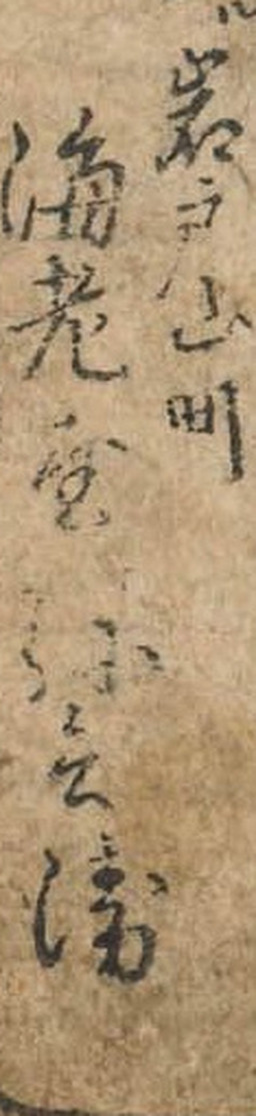海老屋弥兵衛

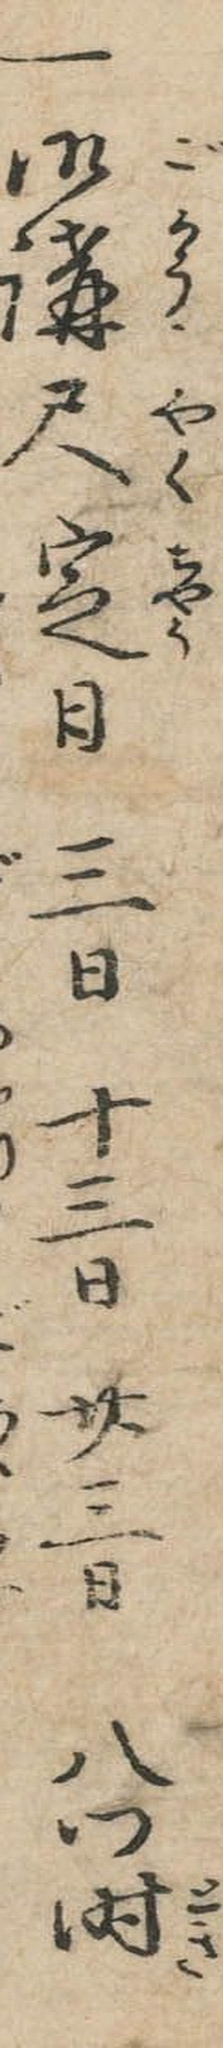一御講尺定日三日十三日二十三日八つ時
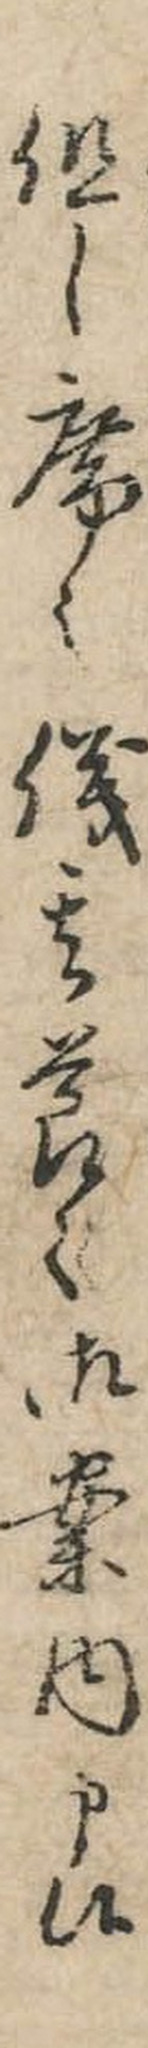但し席之儀其節々御案内申候
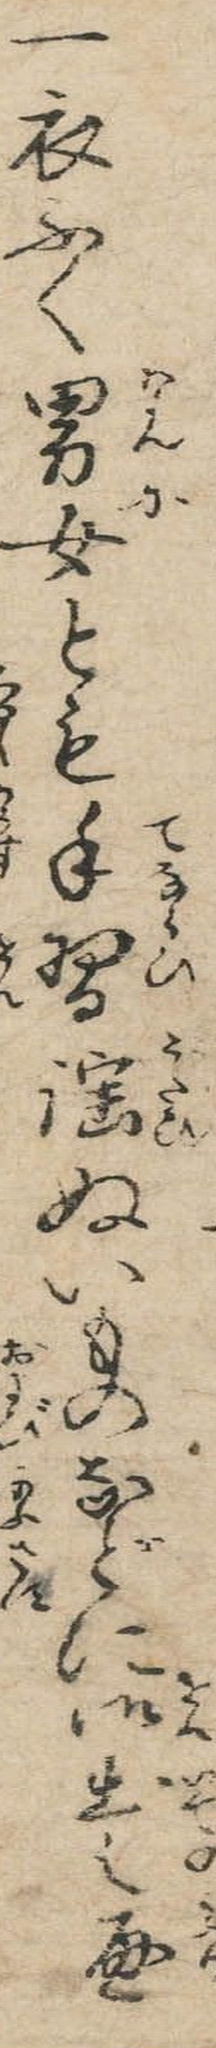一衣ふく男女とも手習謡ぬいものなどに御出之通
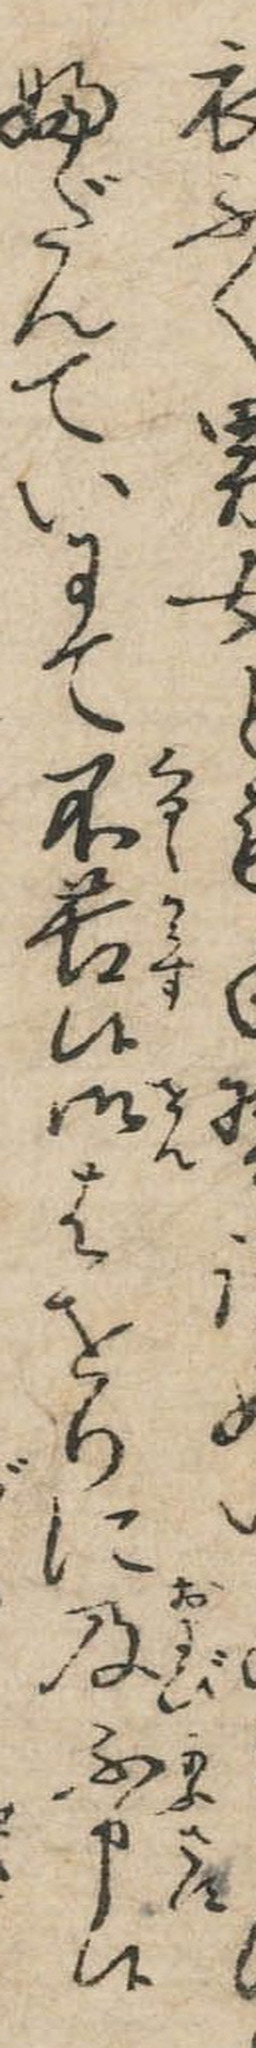ふだんていにて不苦候御はをりに及不申候
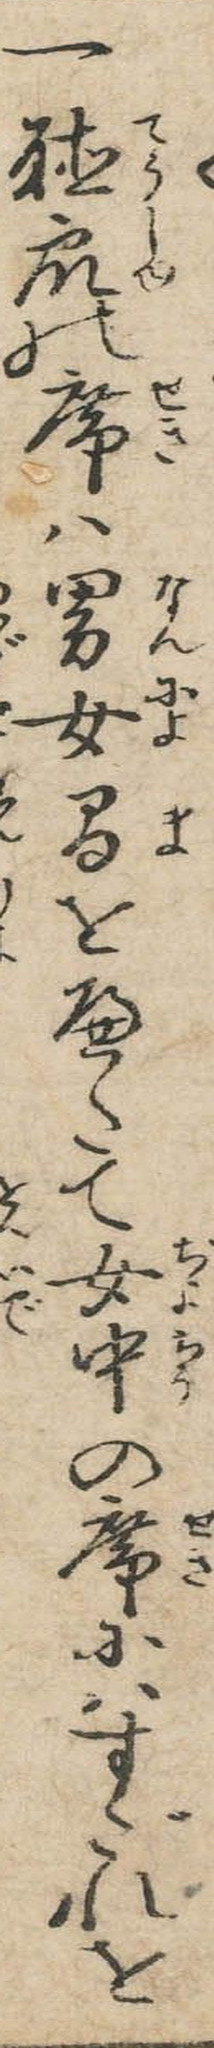一聴衆の席は男女間をへたて女中の席にはすだれを
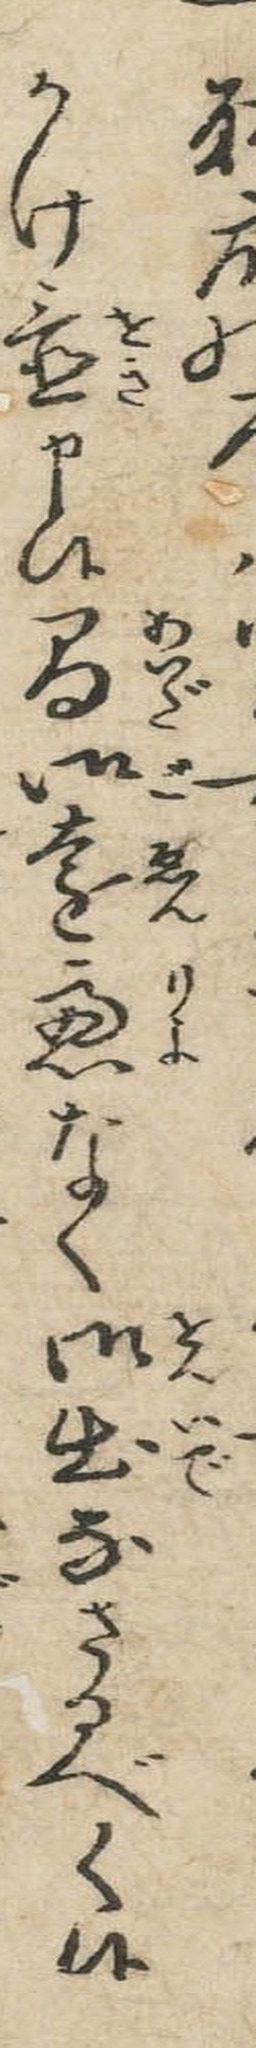かけ置申候間御遠慮なく御出なさるべく候
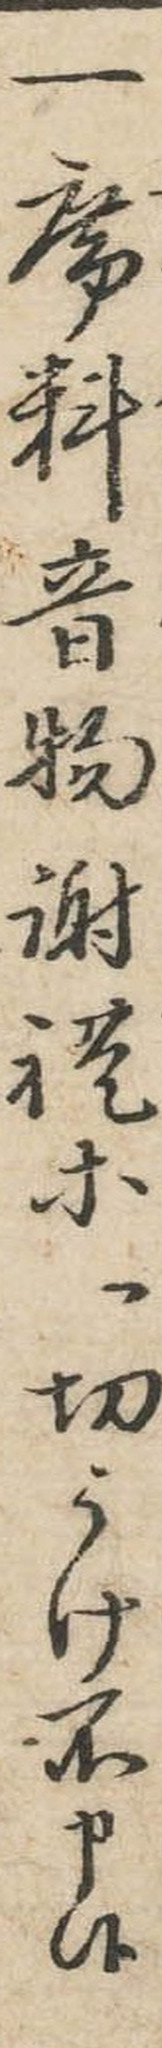一席料音物謝礼等一切うけ不申候
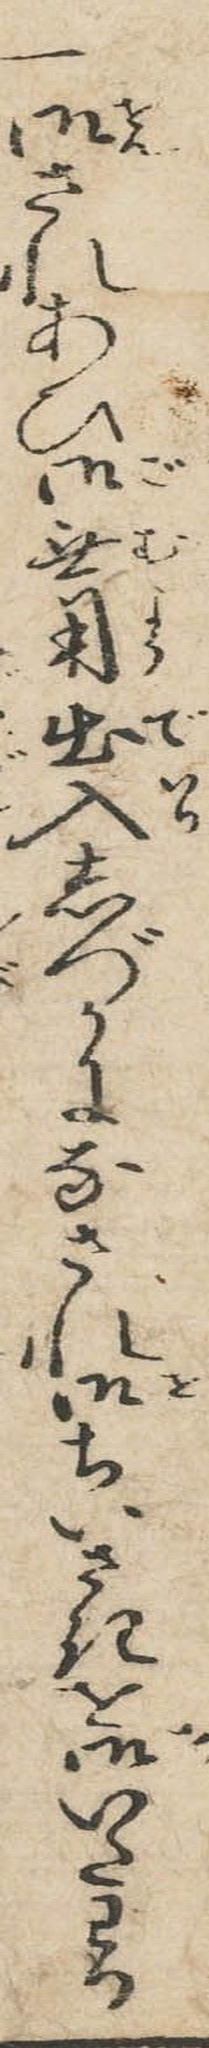一御されあひ御無用出入しづかになされ御ちいさきを御いたわり
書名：前訓
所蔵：東京学芸大学附属図書館
